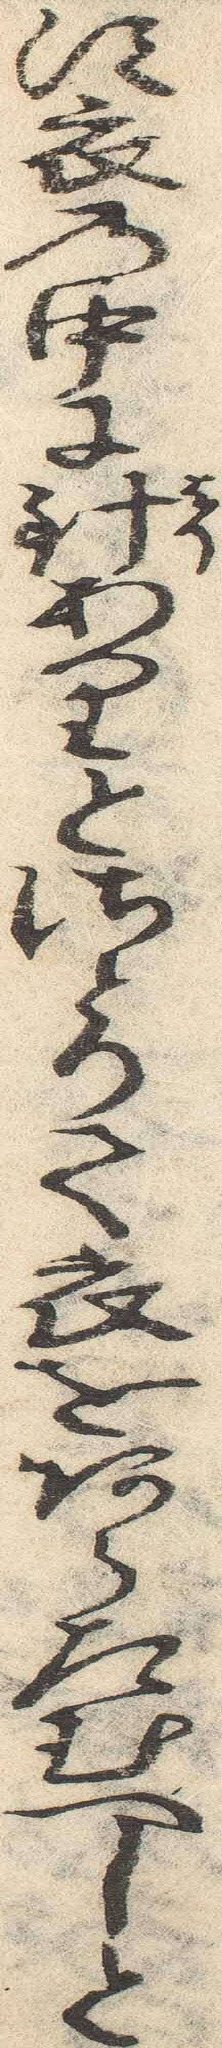す衣の中に針ありとさとりて衣をあらたむへしと
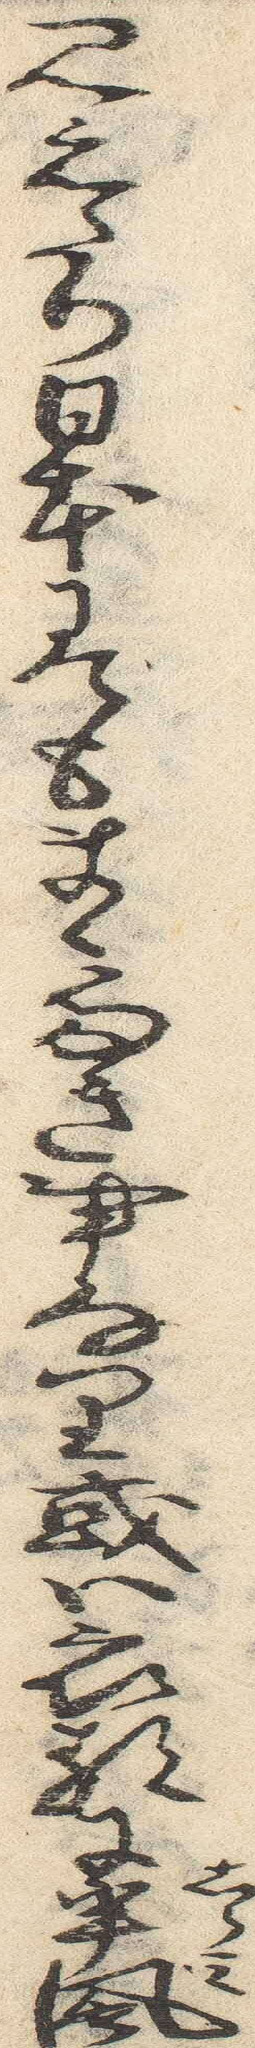見えたり日本にてもまゝ多き事なり或は衣類に半風
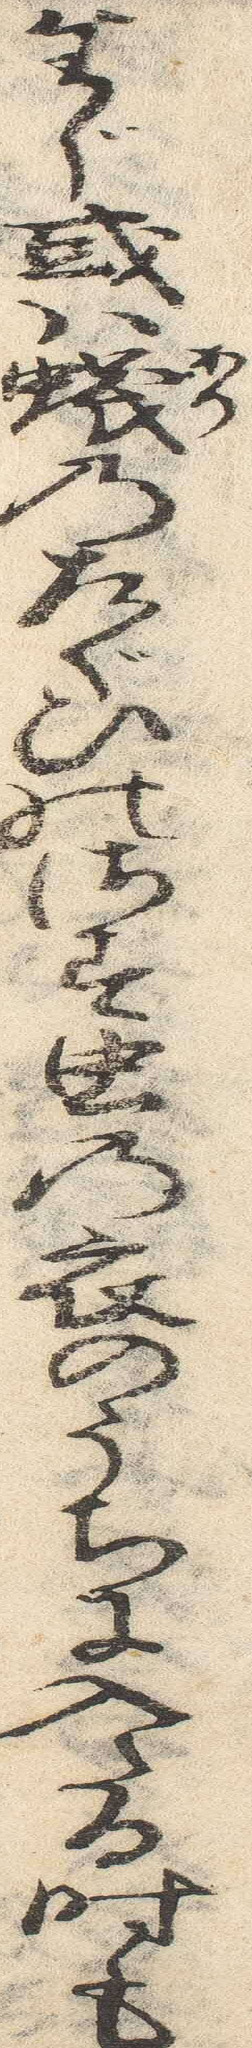生じ或は蟻のたぐひのさす虫の衣のうちに入たる時も
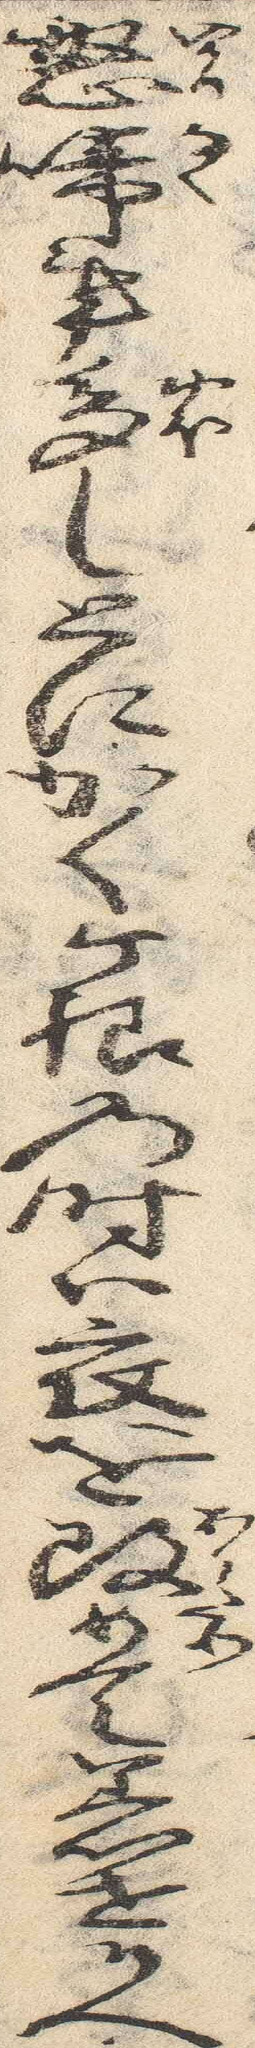怒啼事多しとにかくケ様の時は衣を改めて着せかへ
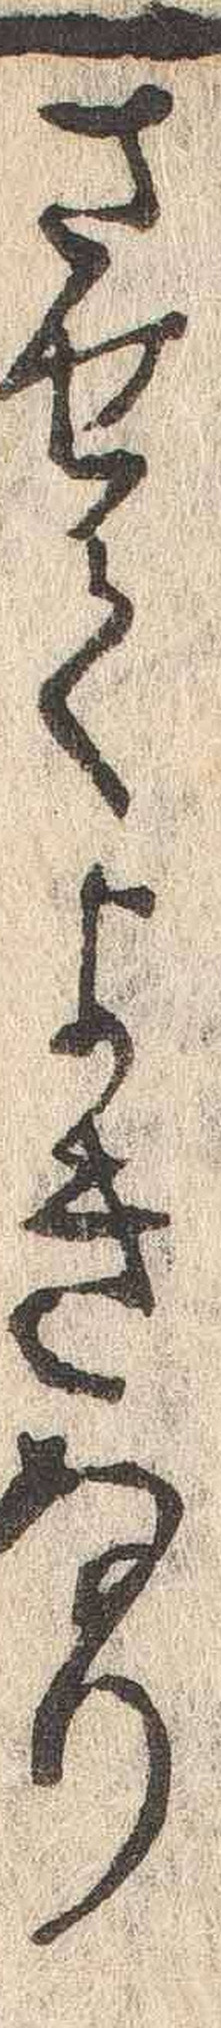させてよきなり
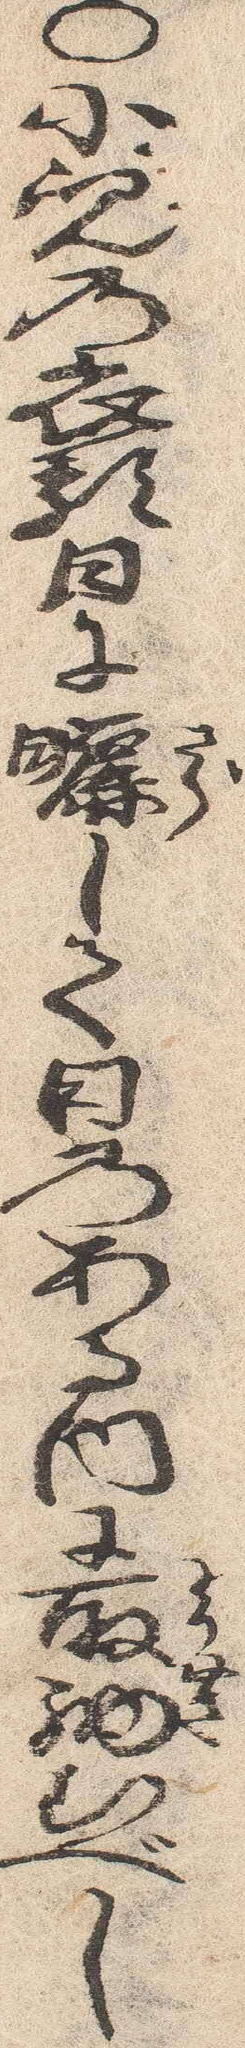◯小児の衣類日に曬して日のある内に取納むべし
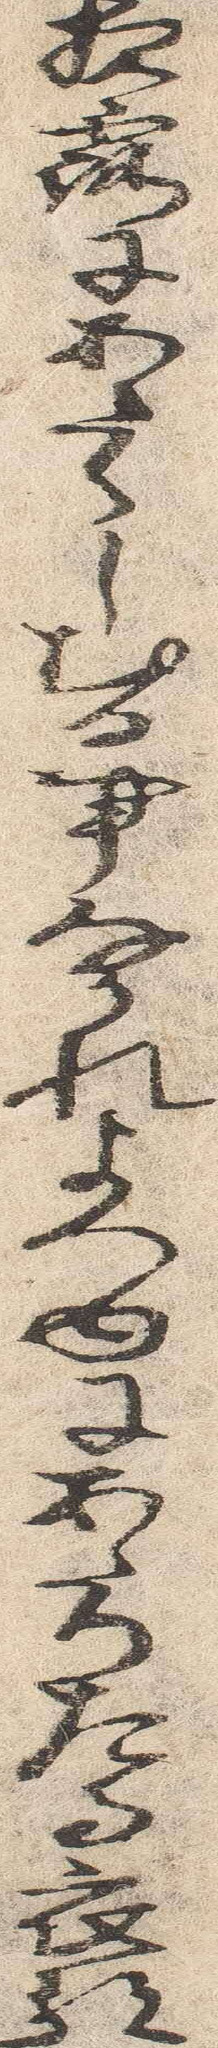夜露にあたらしむる事なかれよつゆにあたりたる衣類
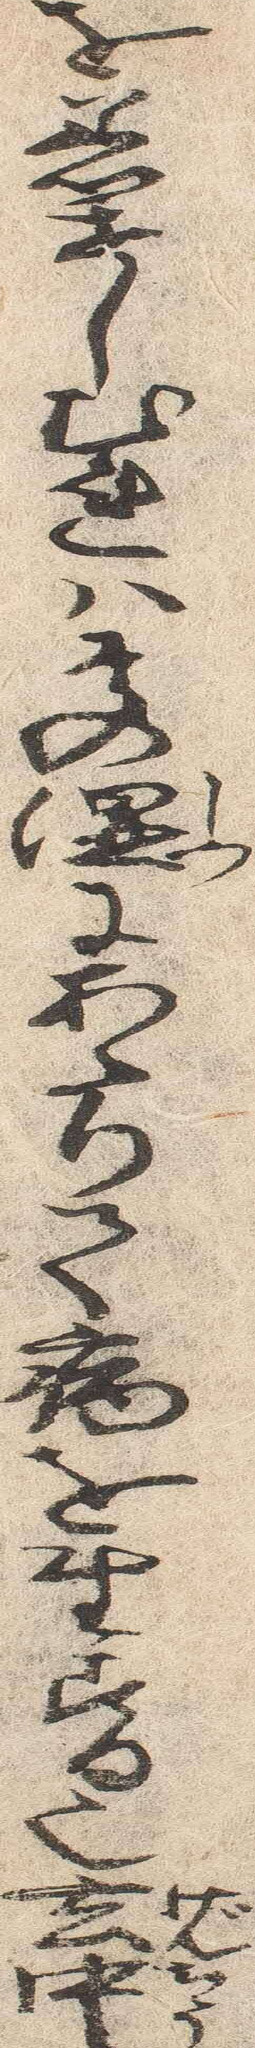を着せしむれはその湿にあたりて病を生する也玄中
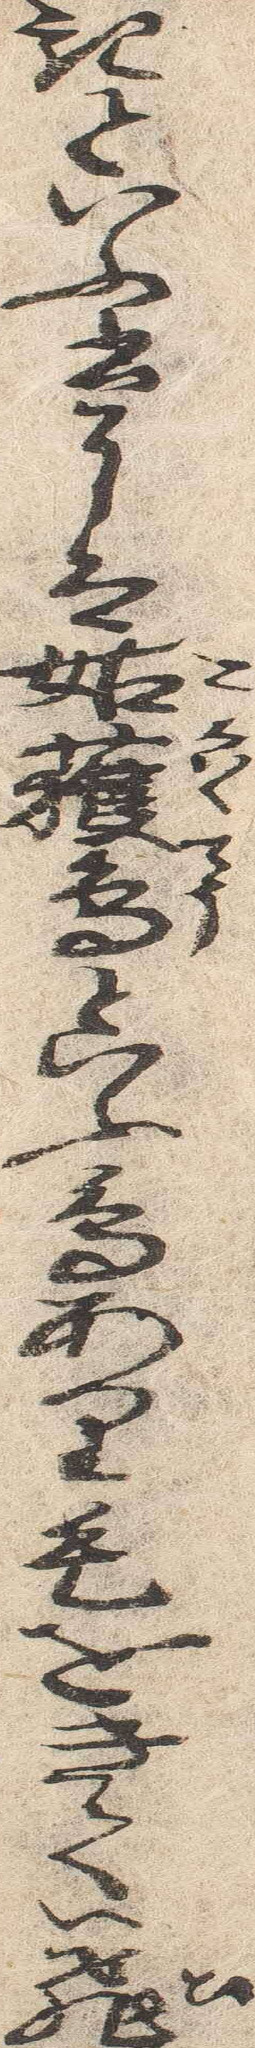記といふ書には姑獲鳥といふ鳥あり毛をきては飛
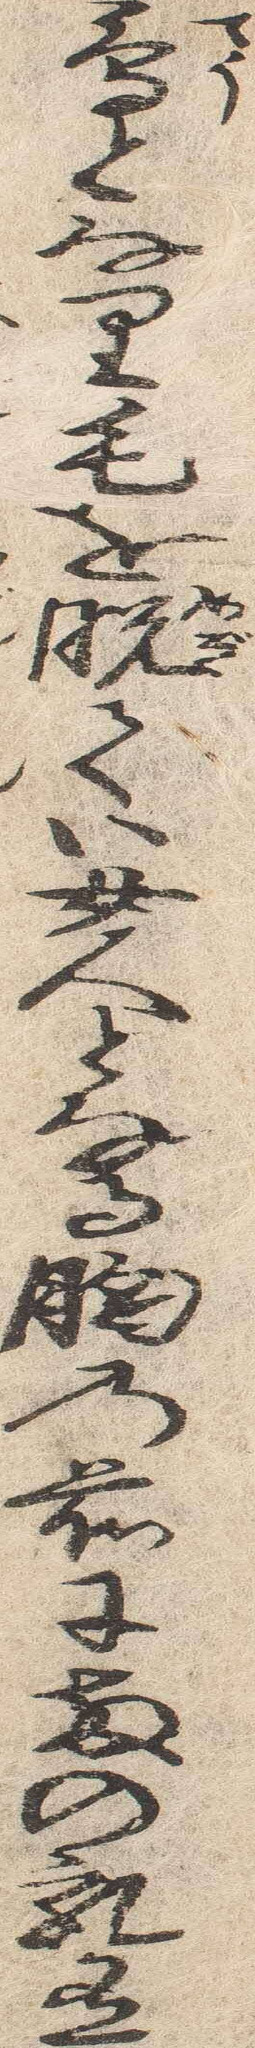鳥となり毛を脱ては女人となる胸の前に両の乳有
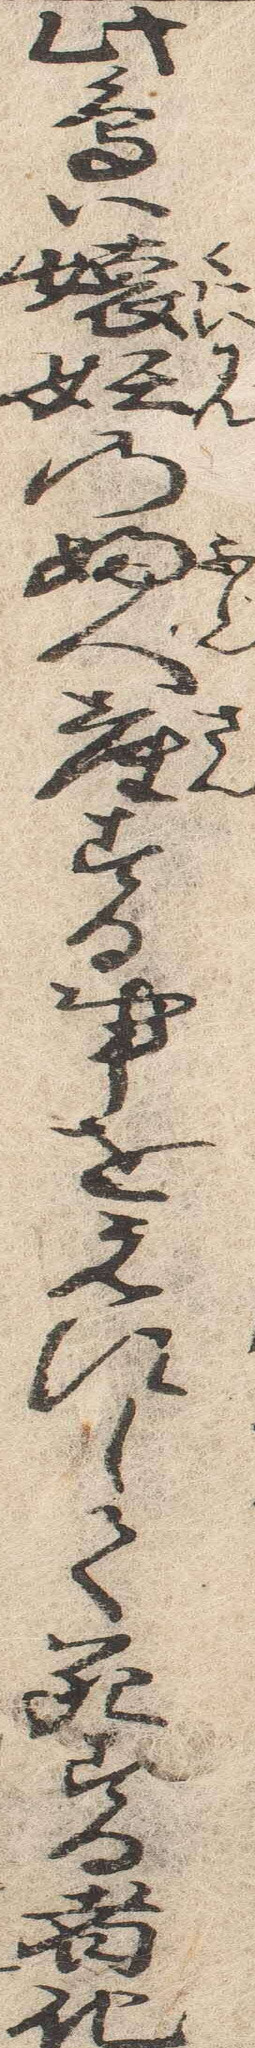此鳥は懐妊の婦人産する事をえすして死する者化
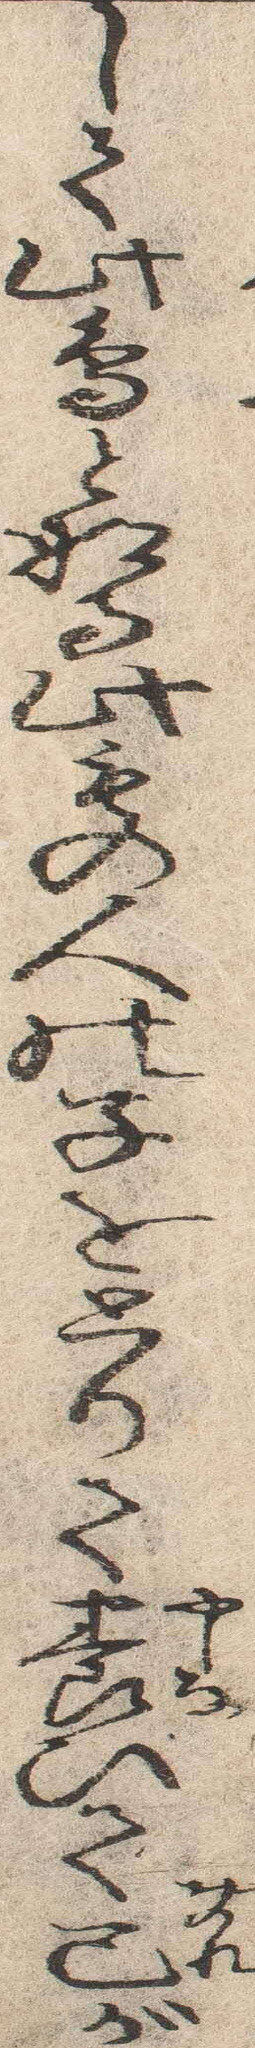して此鳥となる此もの人の子をとりて養ひて己が
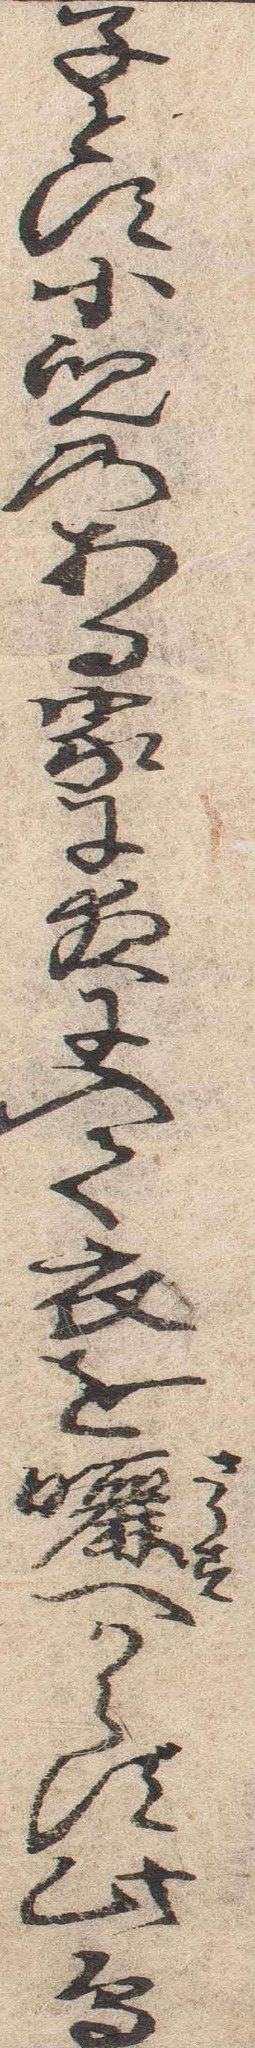子とす小児のある家に夜に入て衣を曬へからす此鳥
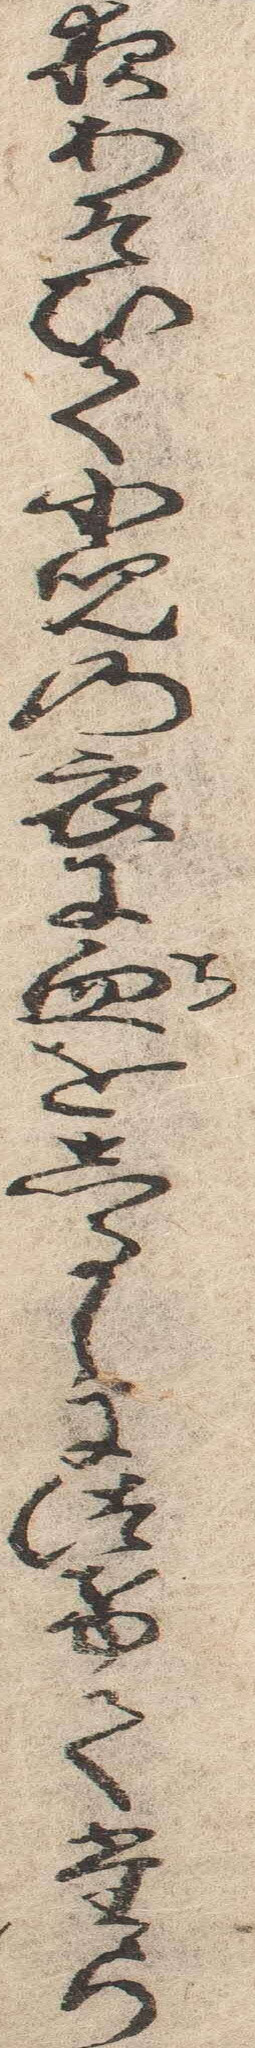夜あそひて小児の衣に血をしるしにつけてたゝり
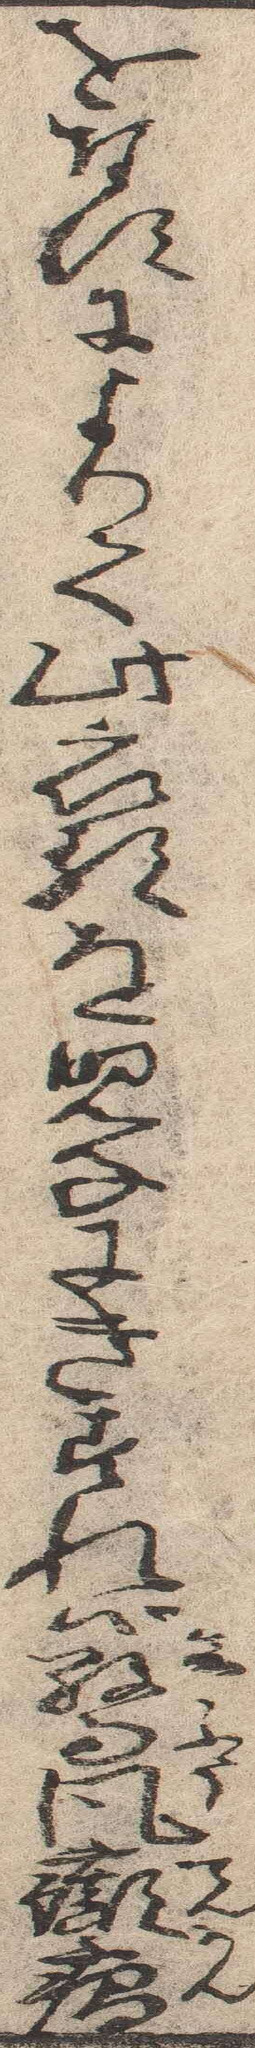をなすによりて此衣類を児子にきすれば驚風癲癇

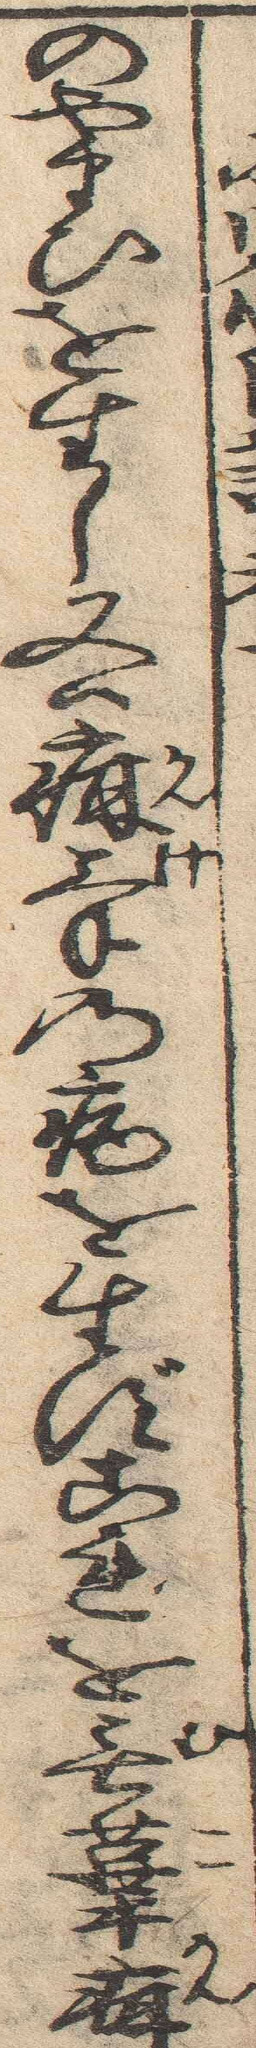のやまひを生し又は疳氣の病を生ずこれを無辜疳
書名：小児必用養育草
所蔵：東京学芸大学附属図書館 国文学研究資料館
